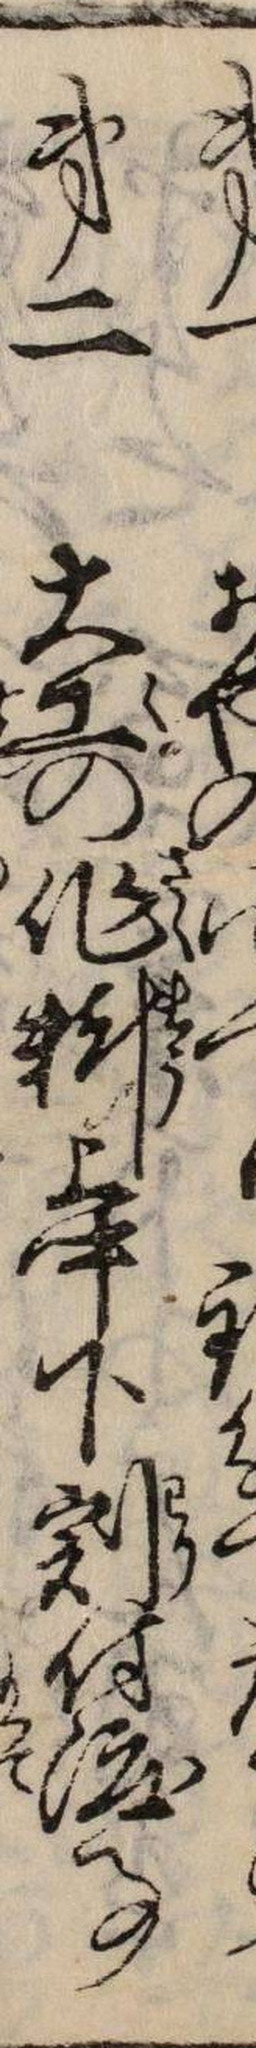第二大工の作料上中下割付渡事
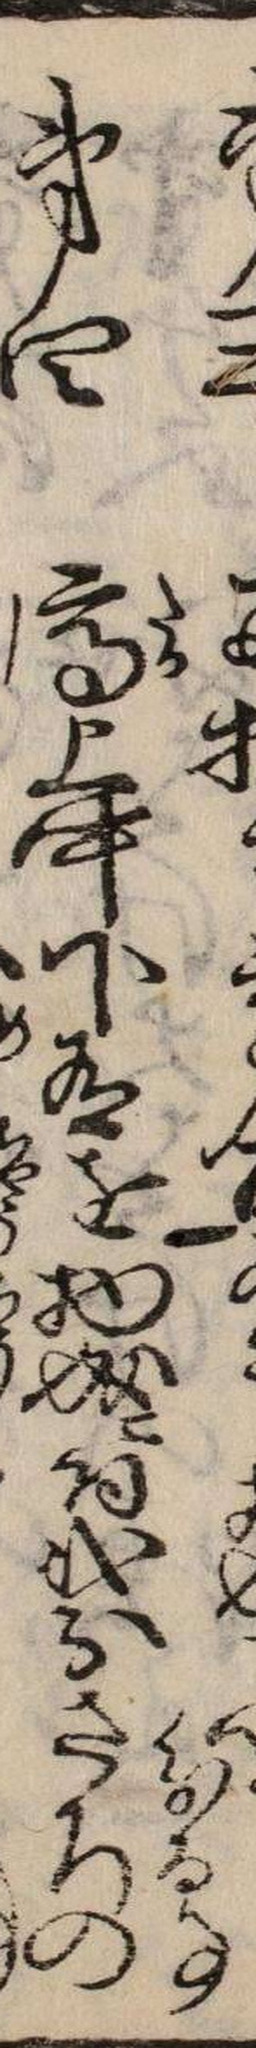第四高上中下有を物成に付弐分さかりの事
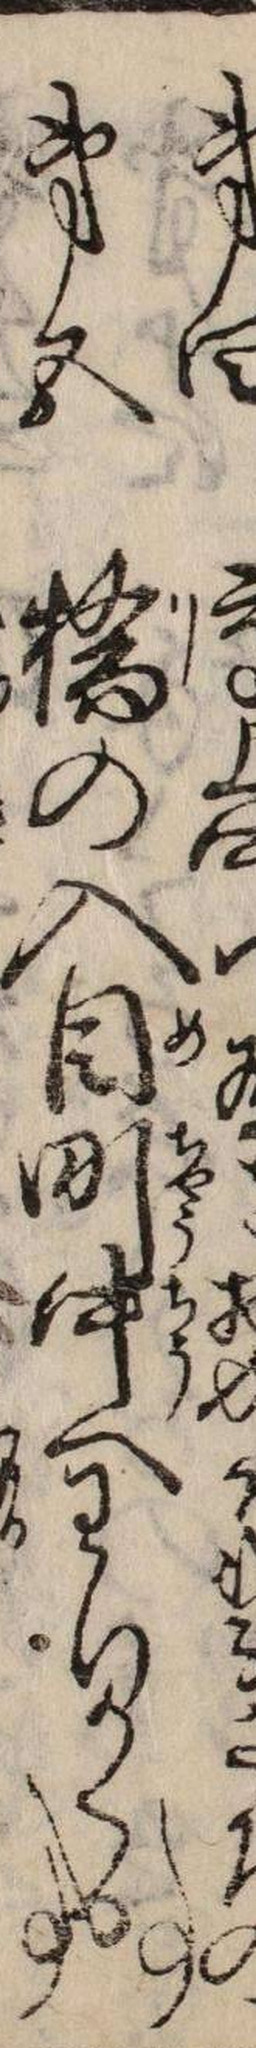第五橋の入目町中へわりかくる事
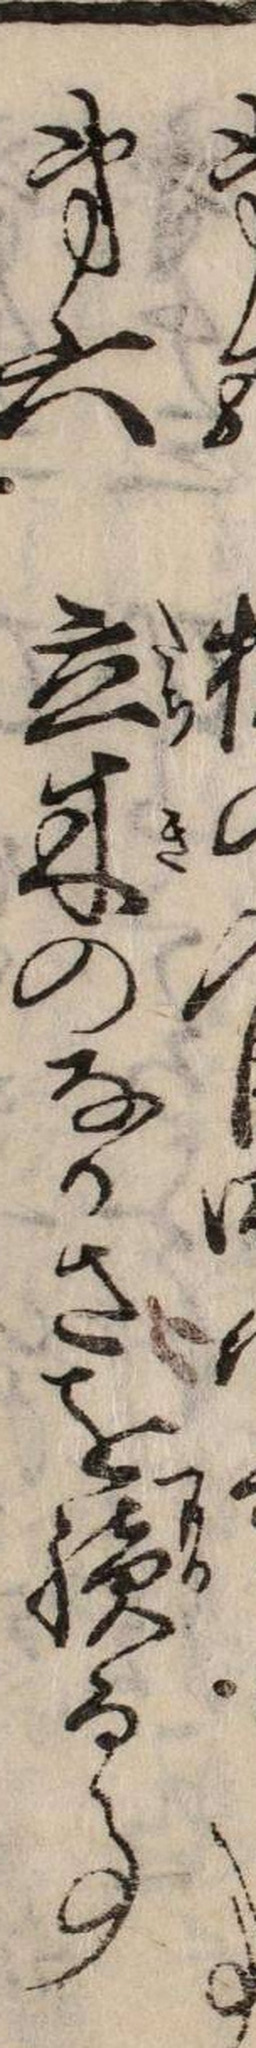第六立木のなかさを積る事
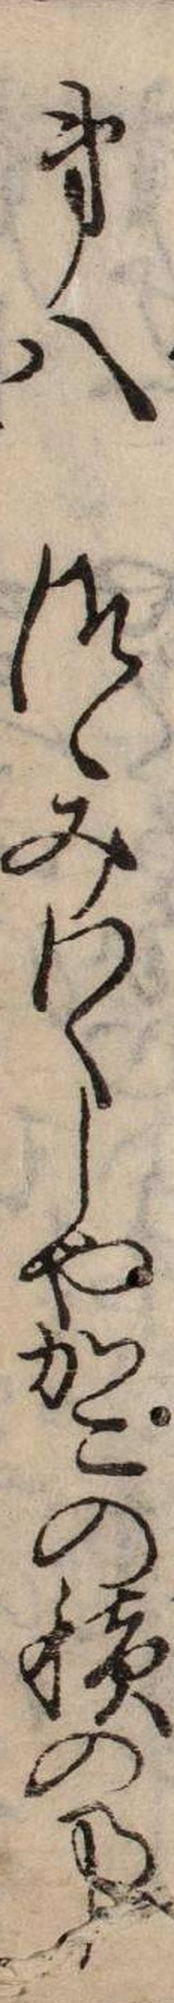第八つつみわくしやかこの積の事
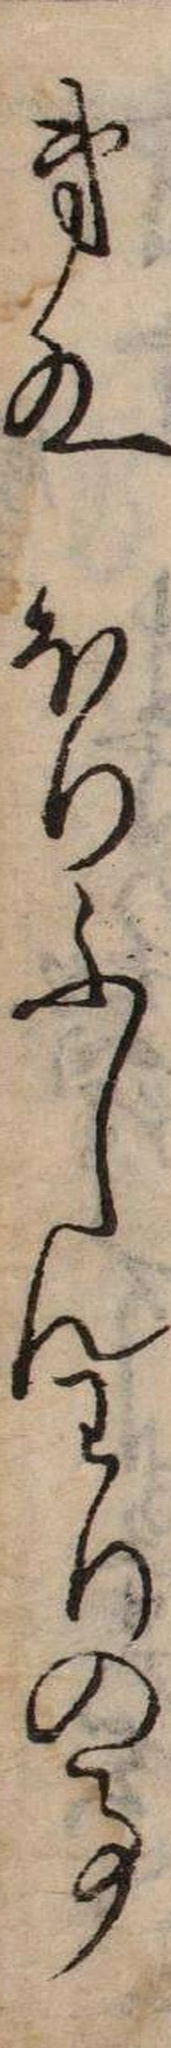第九ほりふしんわりの事

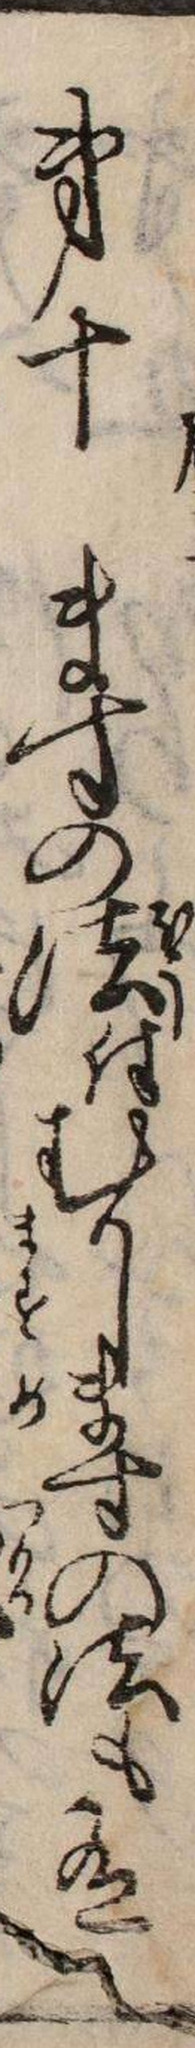第十ますの法付むかしますの法も有
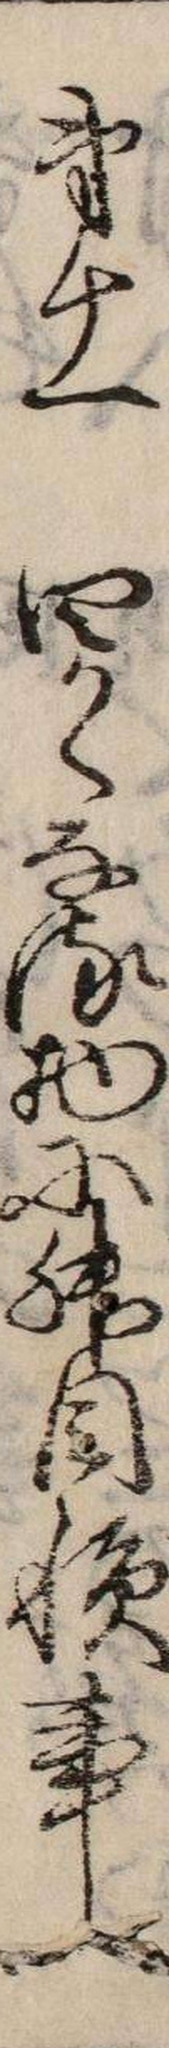第十一四かくなる物に舛目積事
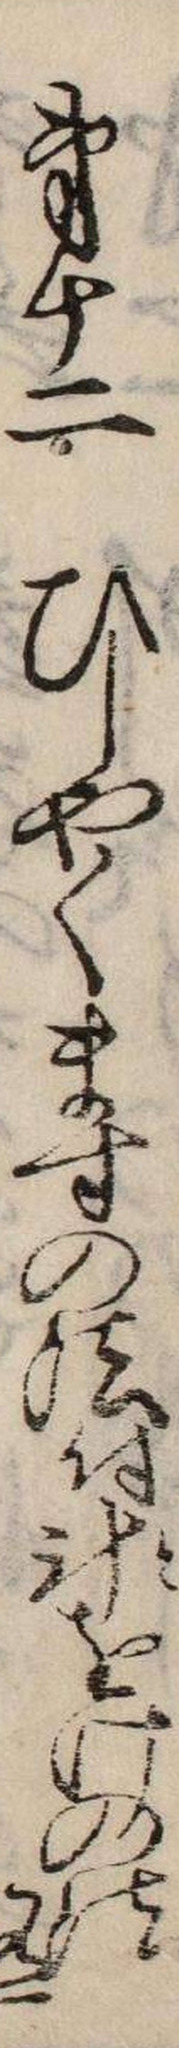第十二ひしやくますの法付斗をけの法有
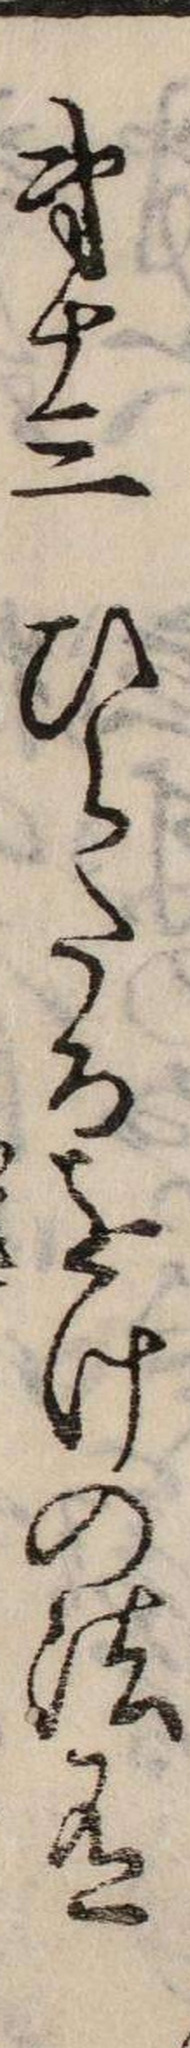第十三ひらたるをけの法有
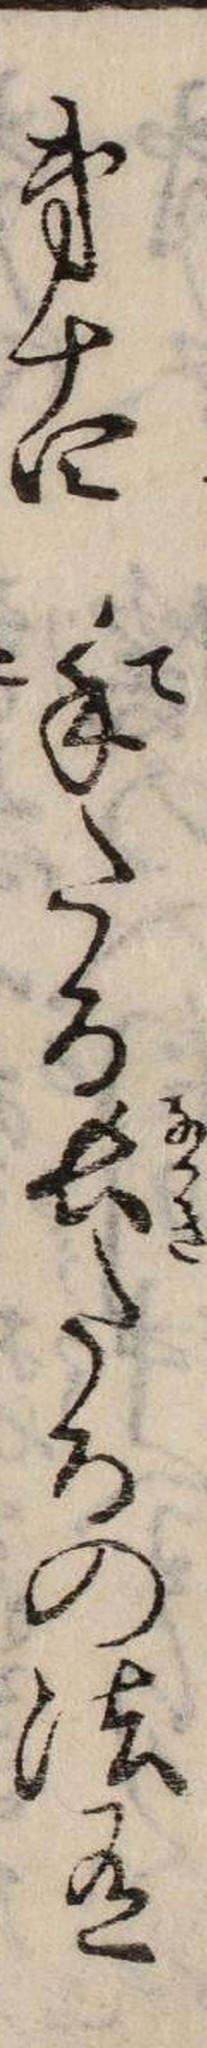第十四手たる長たるの法有
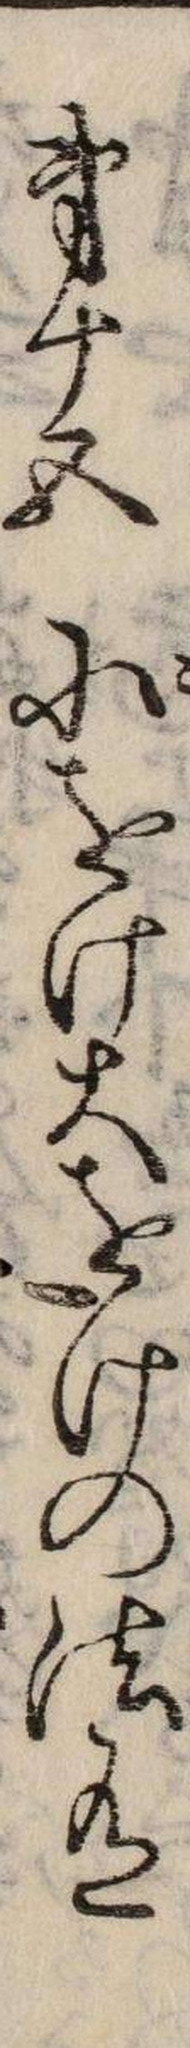第十五小をけ大をけの法有
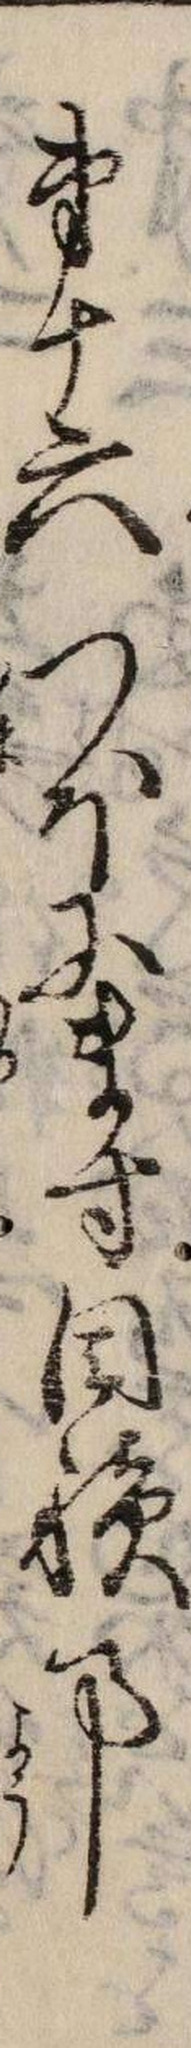第十六つほにます目積事
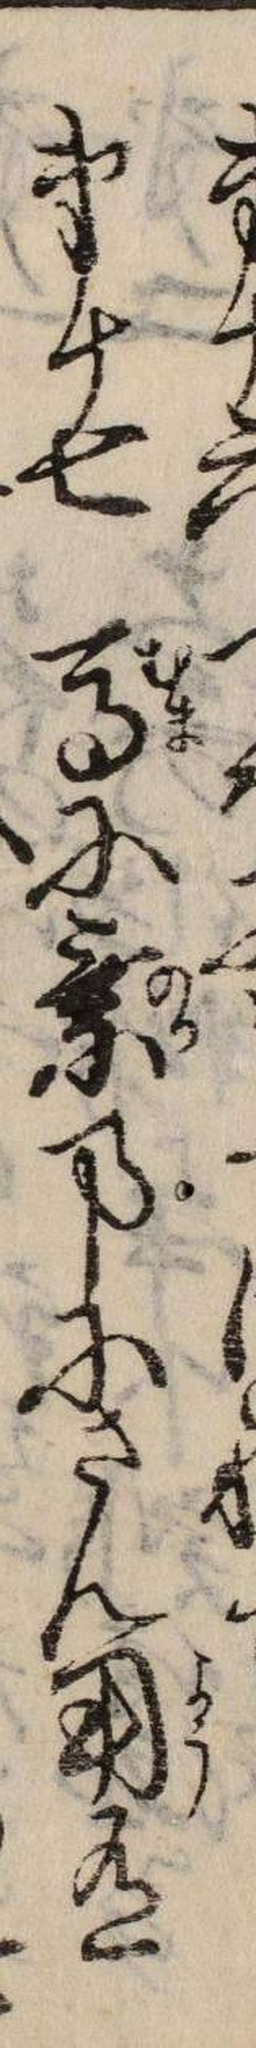第十七馬に乗事にさん用有
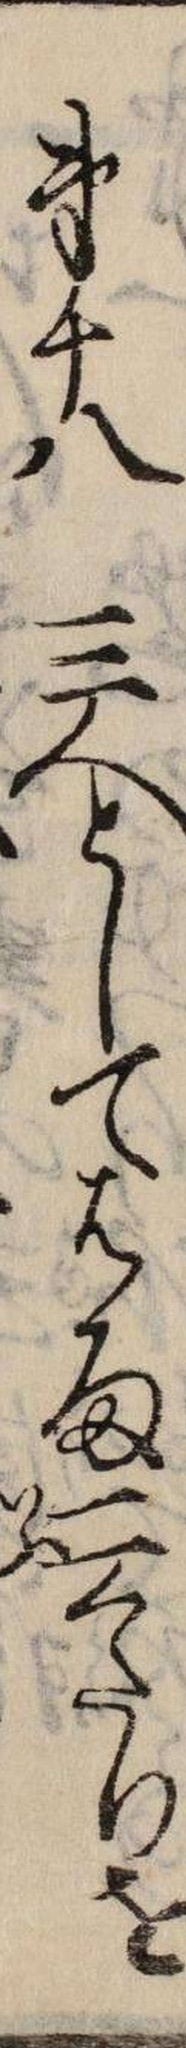第十八三人としてはかま二にくたりを
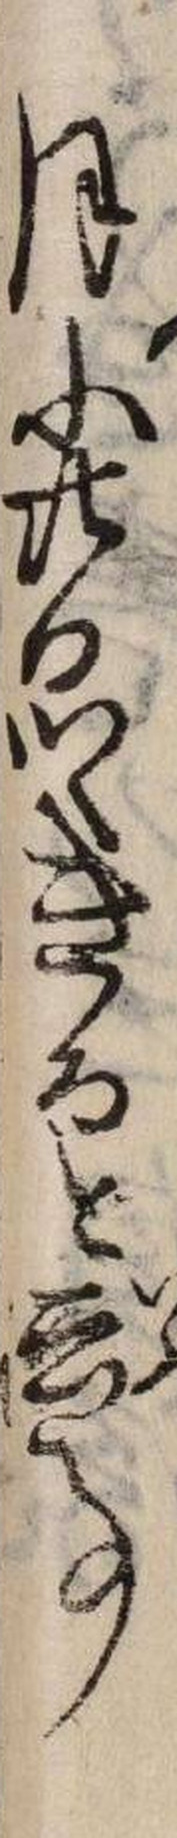月に廿日つつきると云事
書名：塵劫記（寛永11年自跋、京都府立京都学・歴彩館追貴8）
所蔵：京都府立京都学・歴彩館 国文学研究資料館
